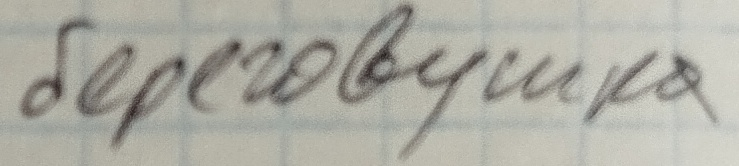береговушка
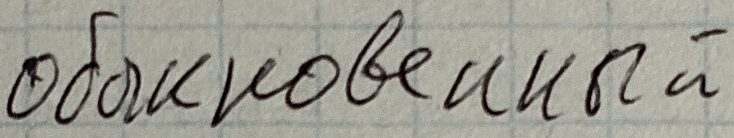обыкновенный
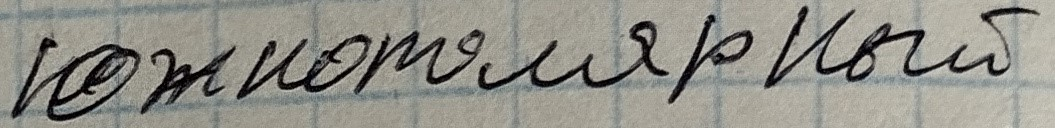южнополярный
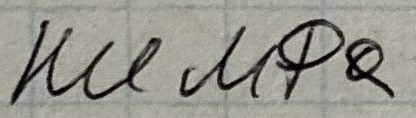нимфа
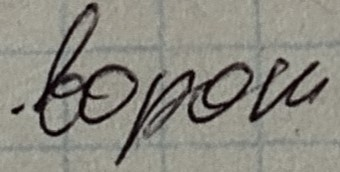ворон
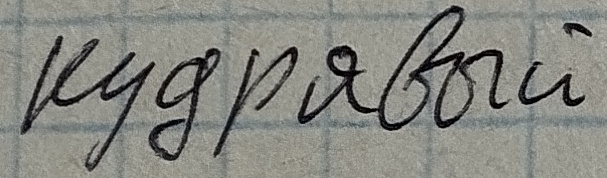кудрявый
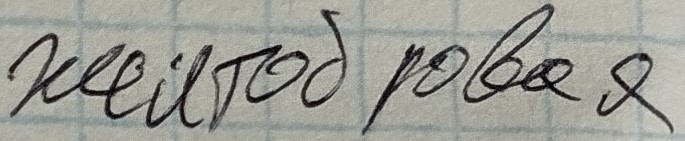желтоб ровая
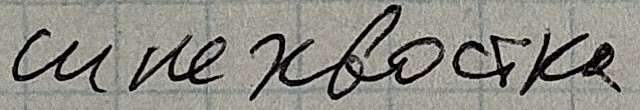синехвостка
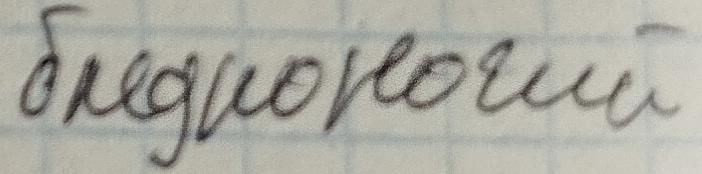бледноногий
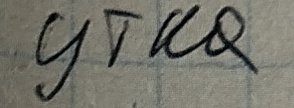утка
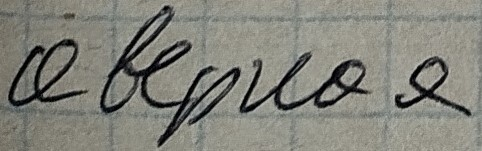северная
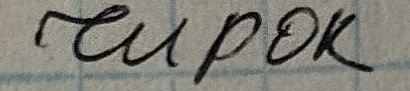чирок
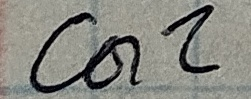сыч
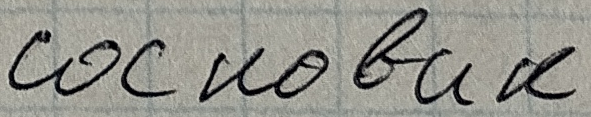сосновик
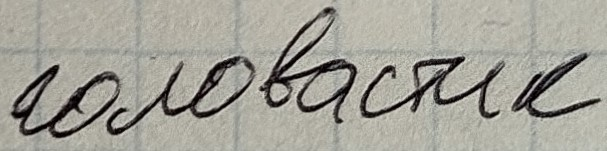головастик
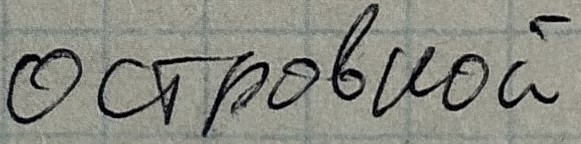островной
